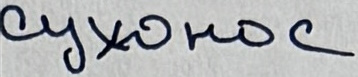сухонос
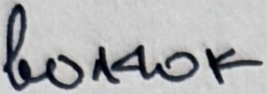волчок
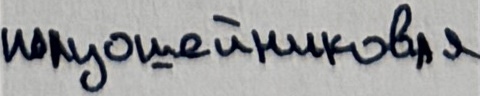полуошейниковая
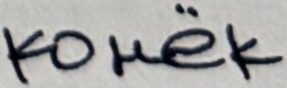конёк
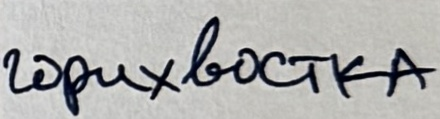горихвостка
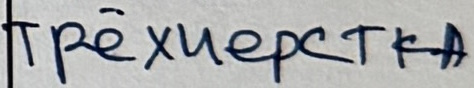трёхперстка
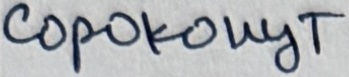сорокопут
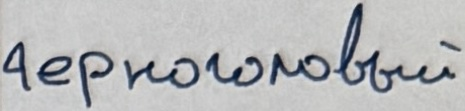черноголовый
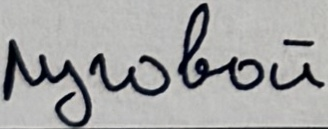луговой
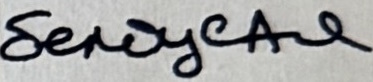белоусая
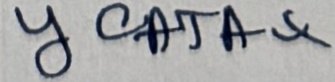усатая
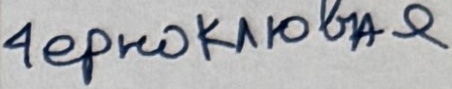черноклювая
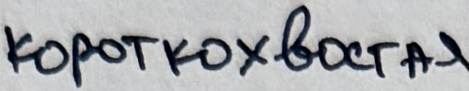короткохвостая
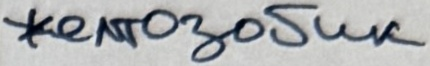желтозобик
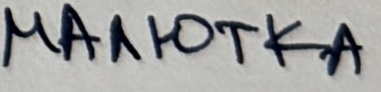малютка
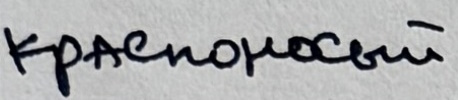красноносый
